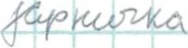зарничка
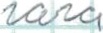гага
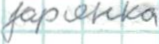зарянка
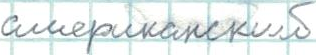американский
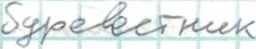буревестник
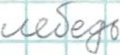лебедь
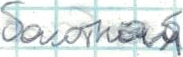болотная
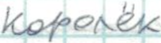королёк
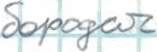бородач
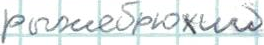рыжебрюхий
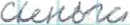синьга
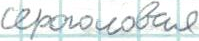сероголовая
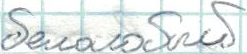белолобый
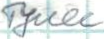тулес
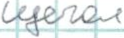щегол
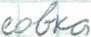совка
